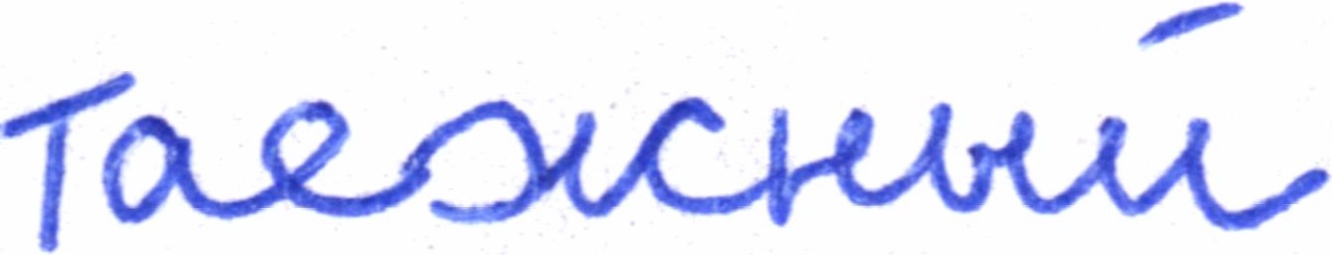таежный
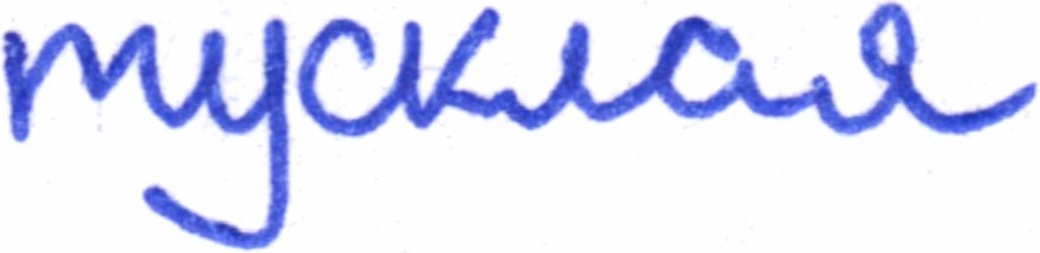тусклая
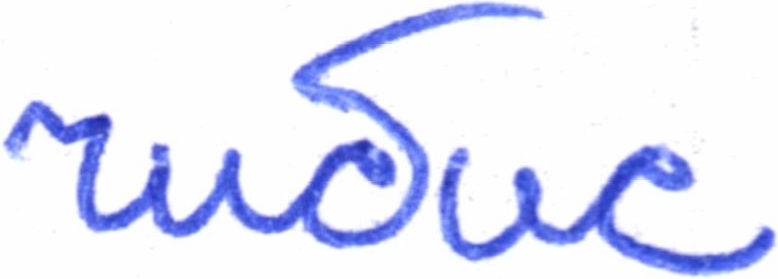чибис
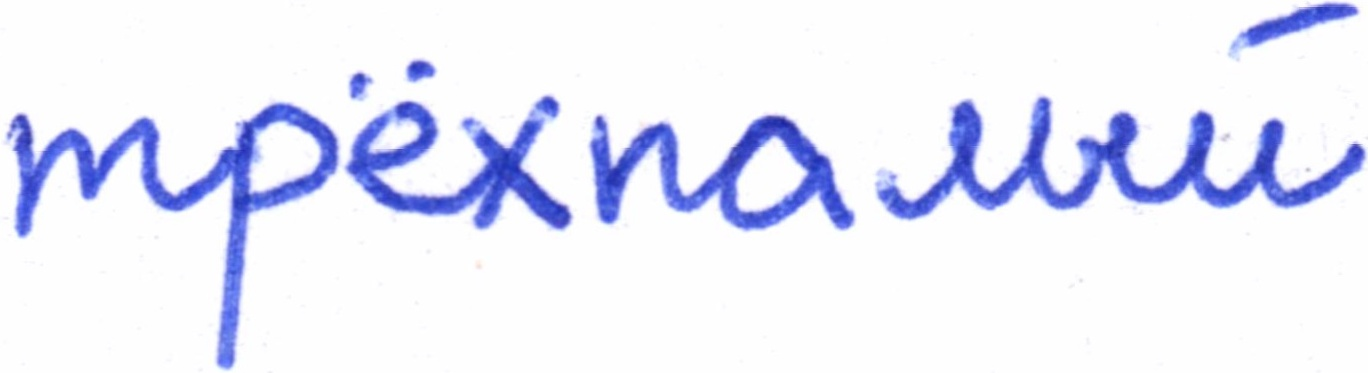трёхпалый
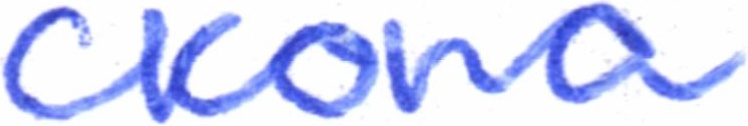скопа
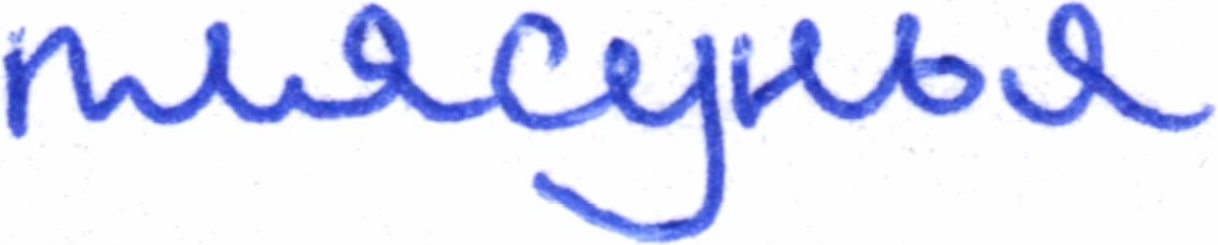плясунья
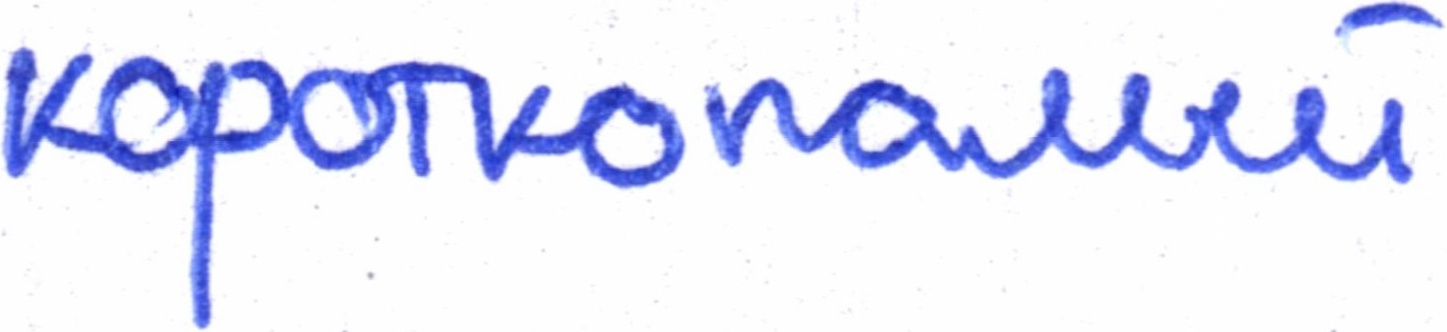короткопалый
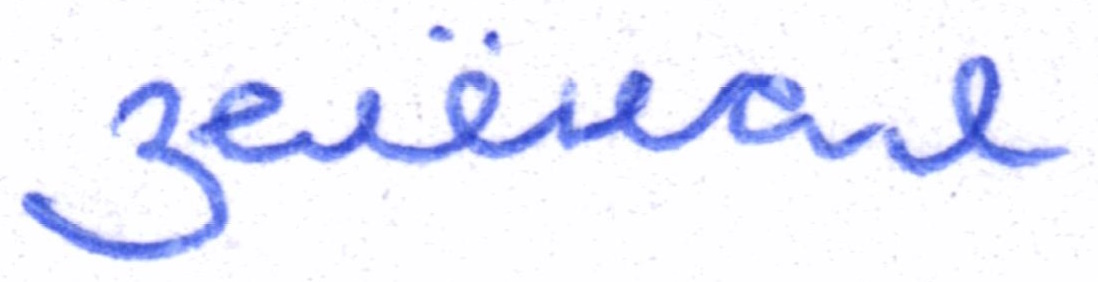зелёная
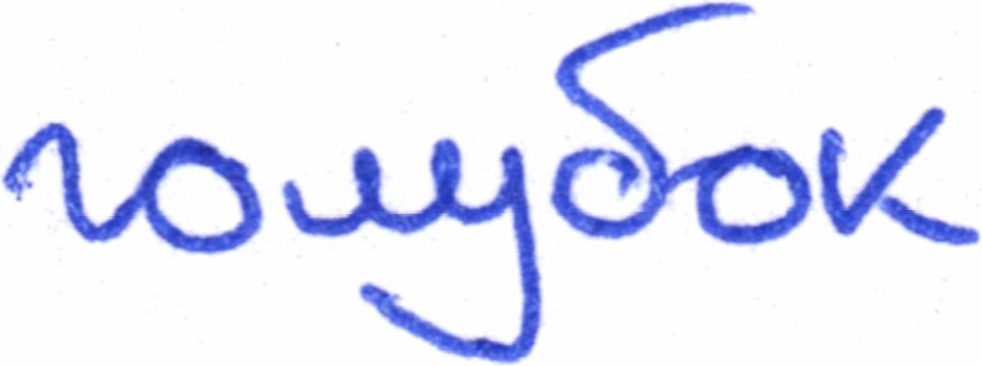голубок
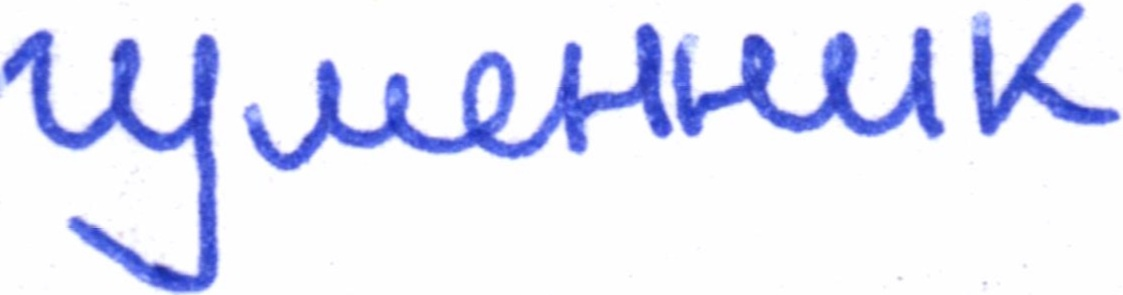гуменник
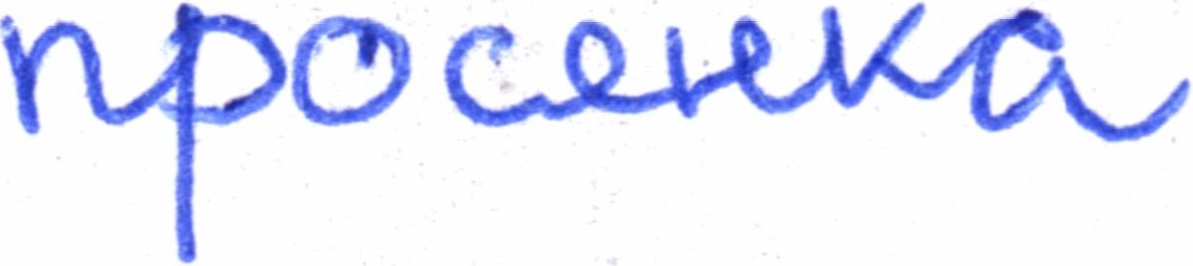просянка
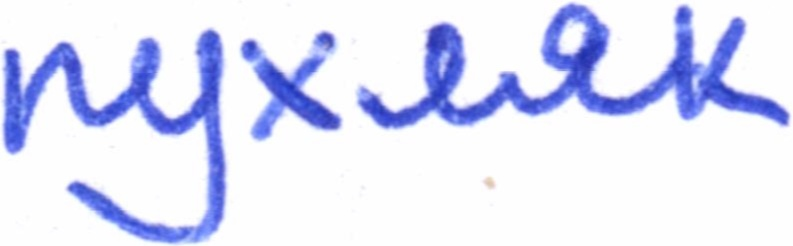пухляк
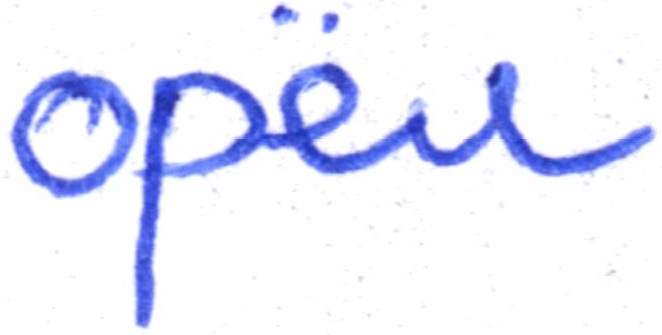орёл
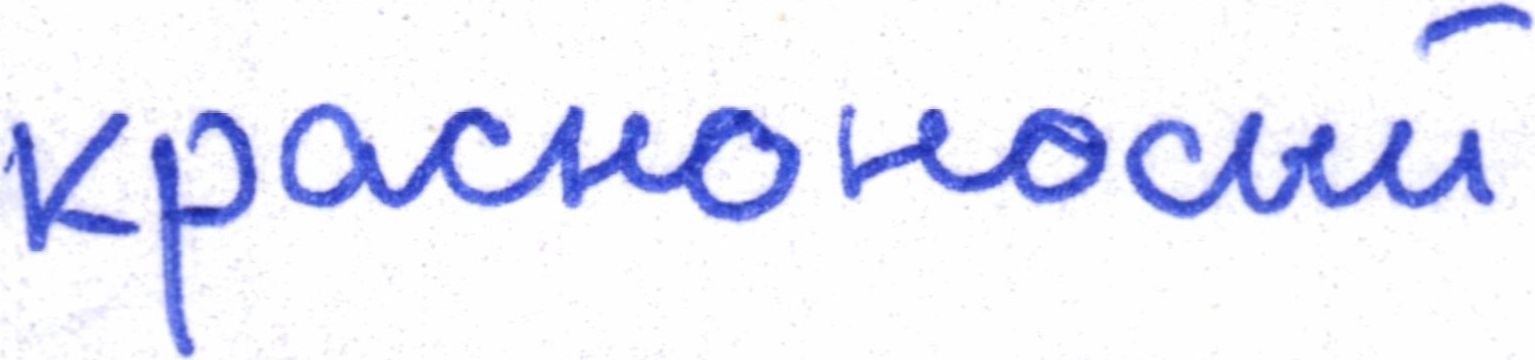красноносый
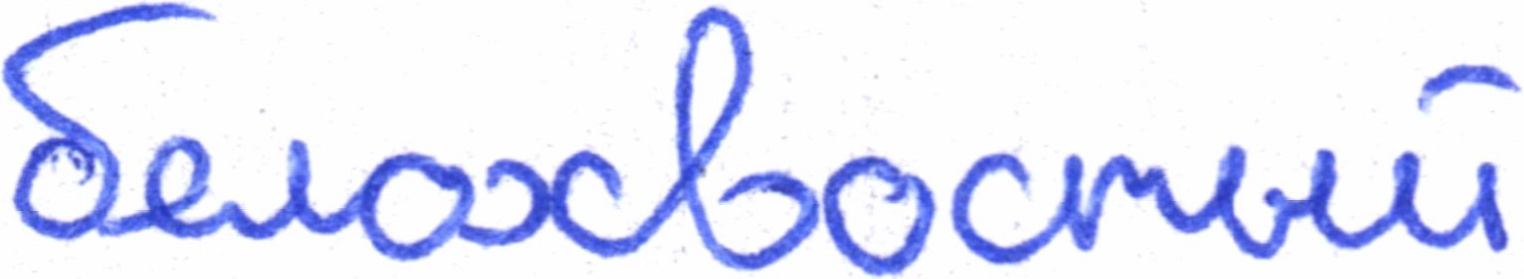белохвостый
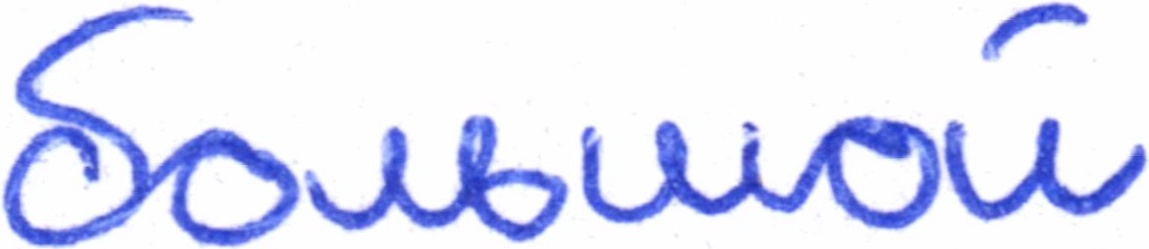большой
